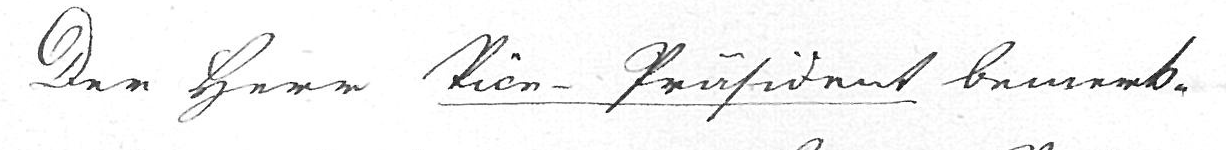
Der Herr Vice-Präsident bemerk-
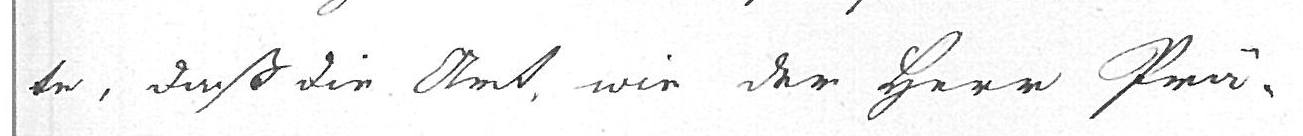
te, daß die Art, wie der Herr Prä-
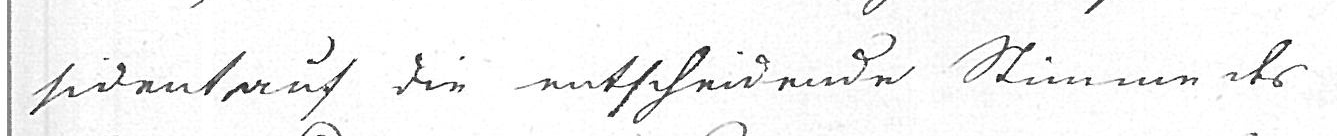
sident auf die entscheidene Stimme des
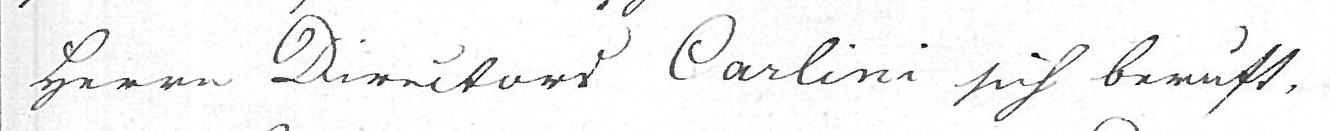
Herrn Directors Carlini sich beruft,
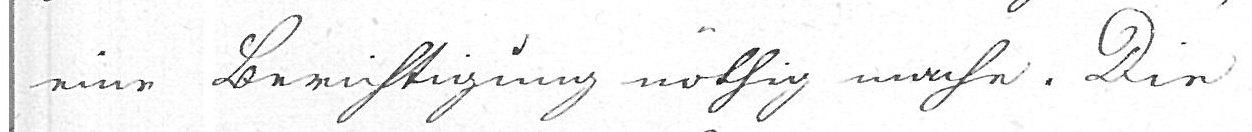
eine Berichtigung nöthig mache. Die
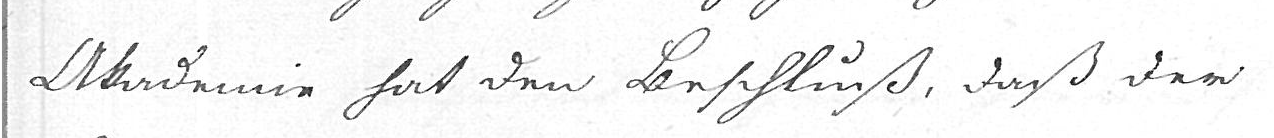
Akademie hat den Beschluß, daß der
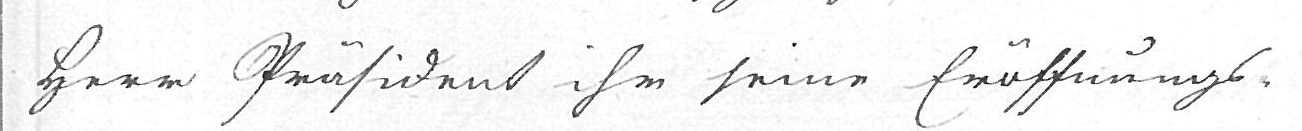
Herr Präsident ihr seine Eröffnungs-
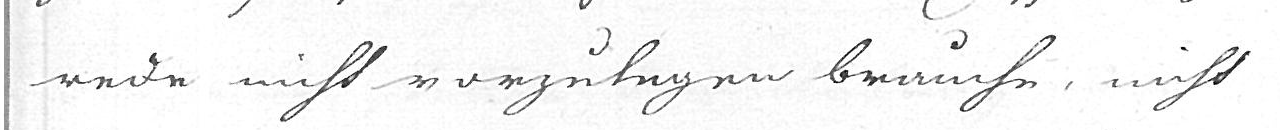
rede nicht vorzulegen brauche, nicht
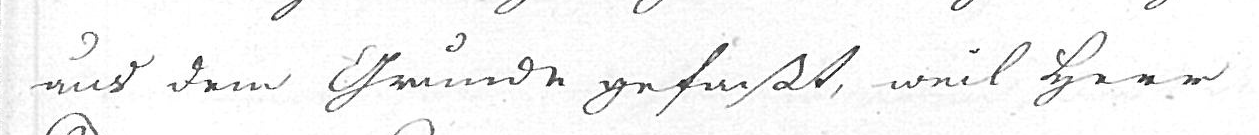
aus dem Grunde gefaßt, weil Herr
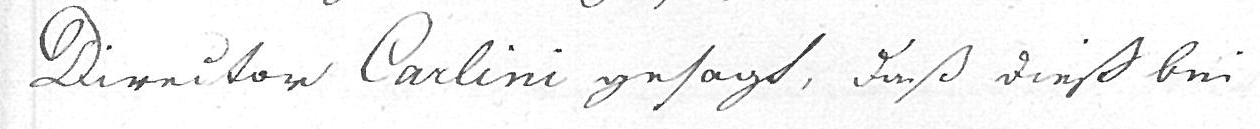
Director Carlini gesagt, daß dieß bei
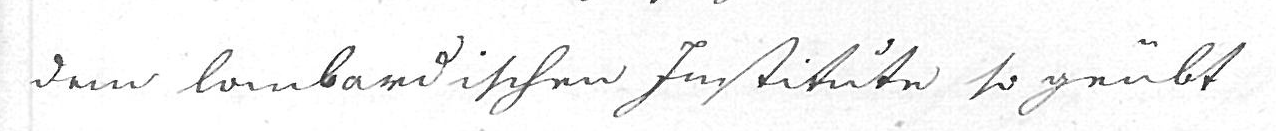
dem lombardischen Institute so geübt
